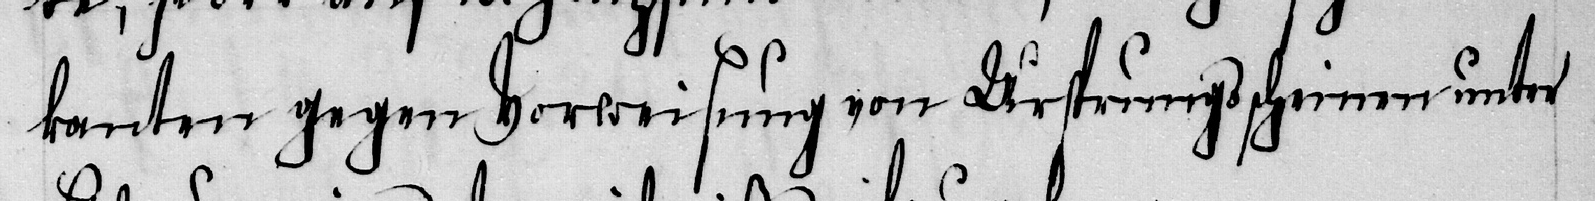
kanten gegen Vorweisung von Ursprungsscheinen unter
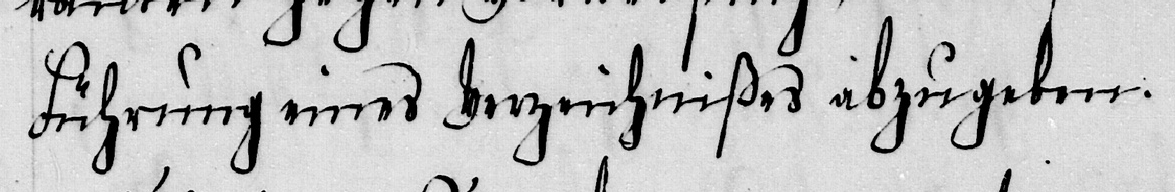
Führung eines Verzeichnißes abzugeben.
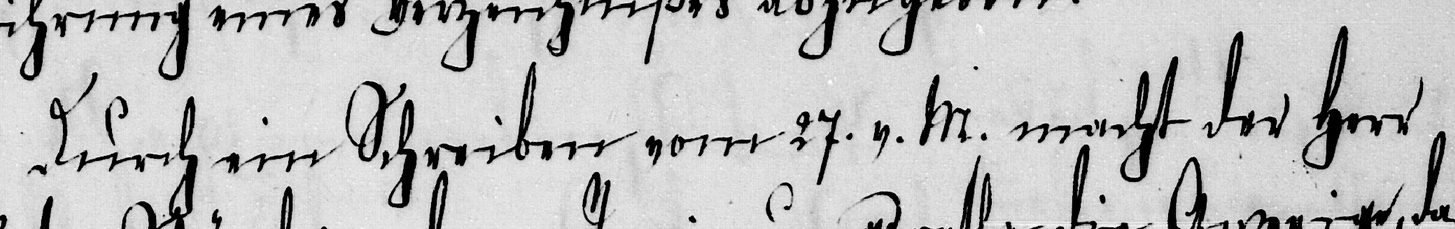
Durch ein Schreiben vom 27. v. M. macht der Herr
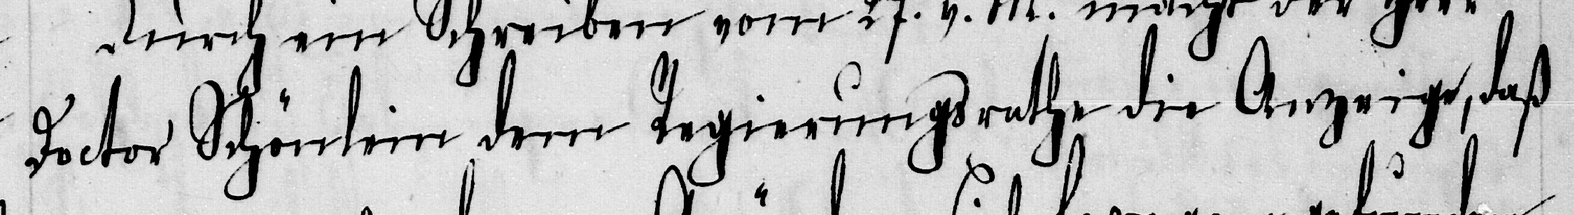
Doctor Schönlein dem Regierungsrathe die Anzeige, daß
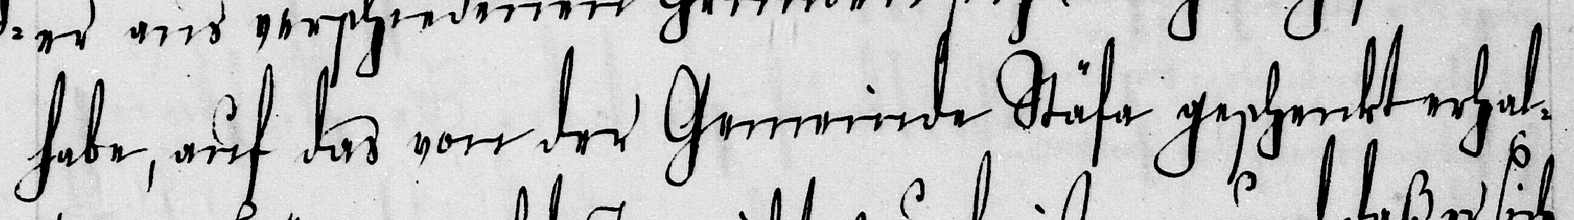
habe, auf das von der Gemeinde Stäfa geschenkt erhal¬
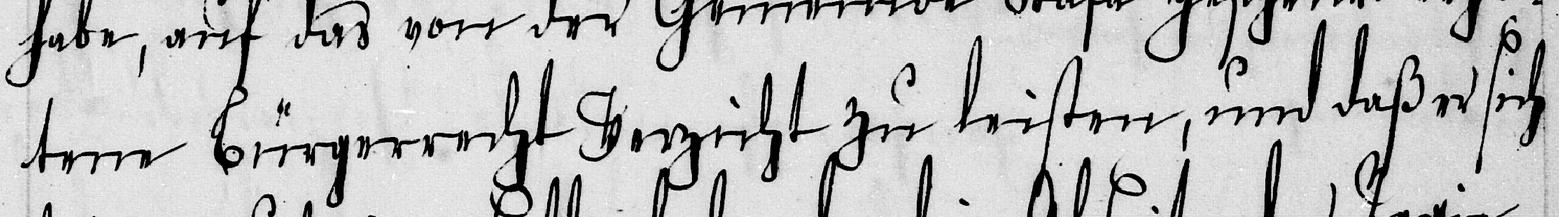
tene Bürgerrecht Verzicht zu leisten, und daß er sich
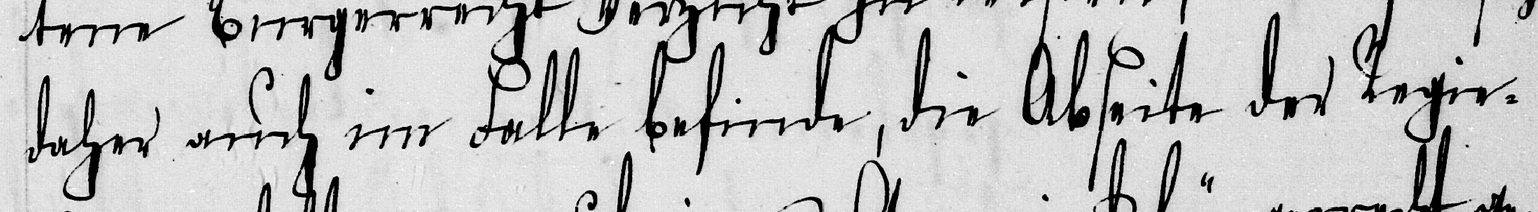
daher auch im Falle befinde, die Abseite der Regie¬
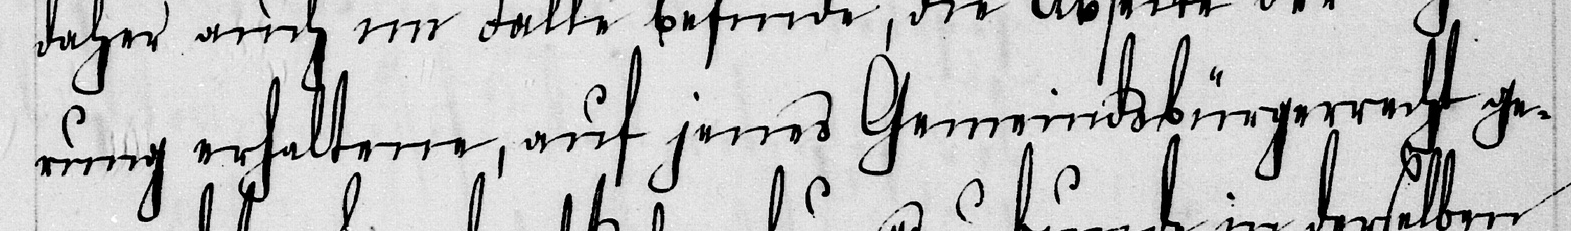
rung erhaltene, auf jenes Gemeindsbürgerrecht ge¬
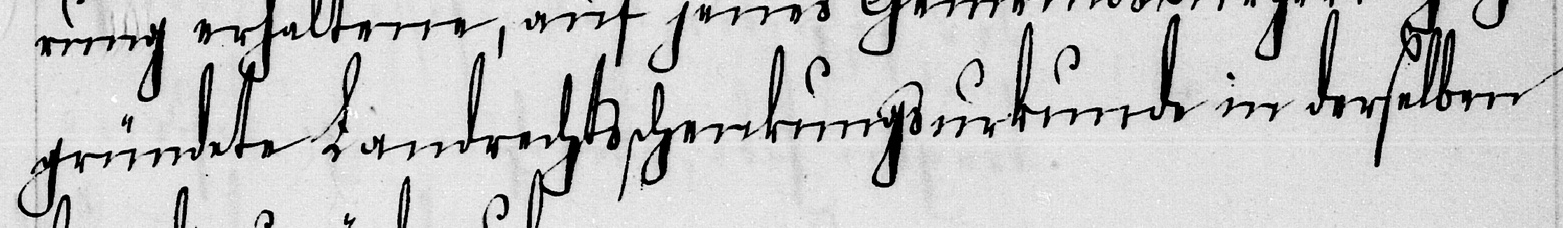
gründete Landrechtsschenkungsurkunde in derselben
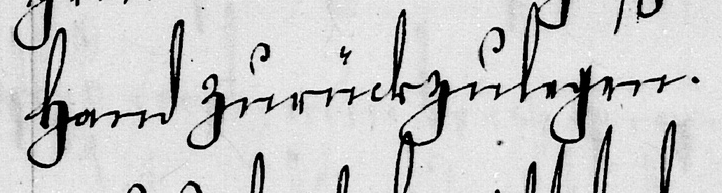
Hand zurückzugeben.
